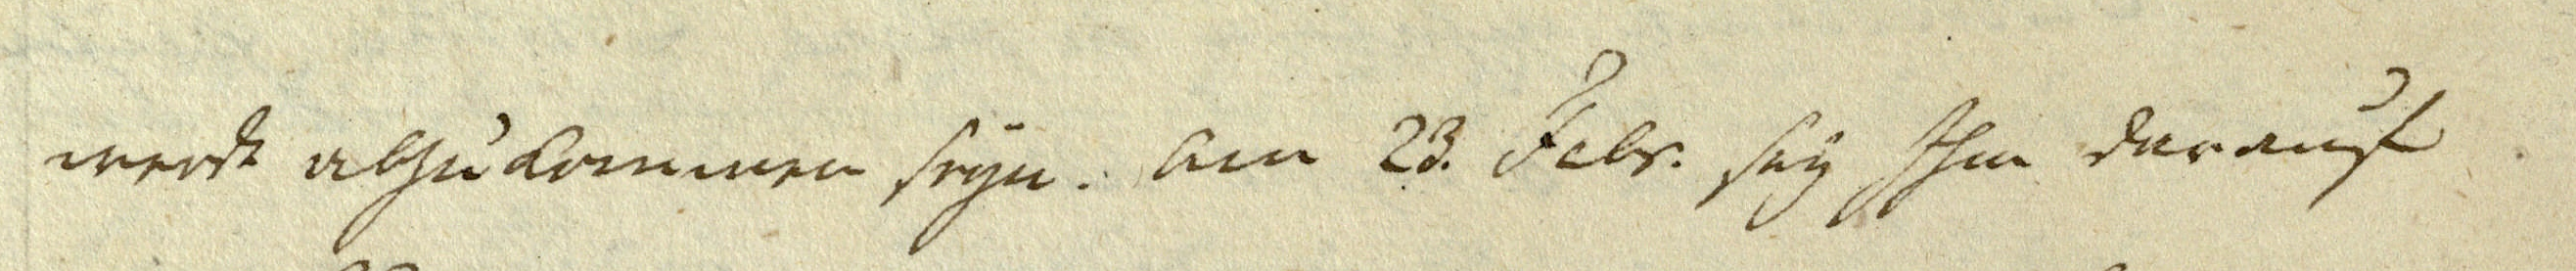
werde abzukommen seÿn. Am 23. Febr. seÿ Ihm darauf
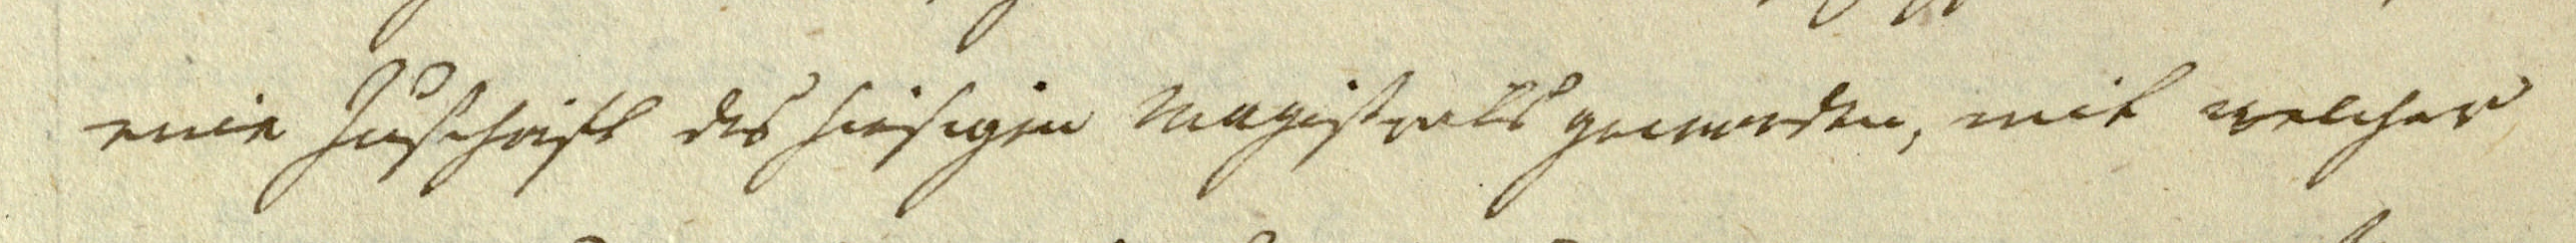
eine Zuschrift des hiesigen Magistrats geworden, mit welcher
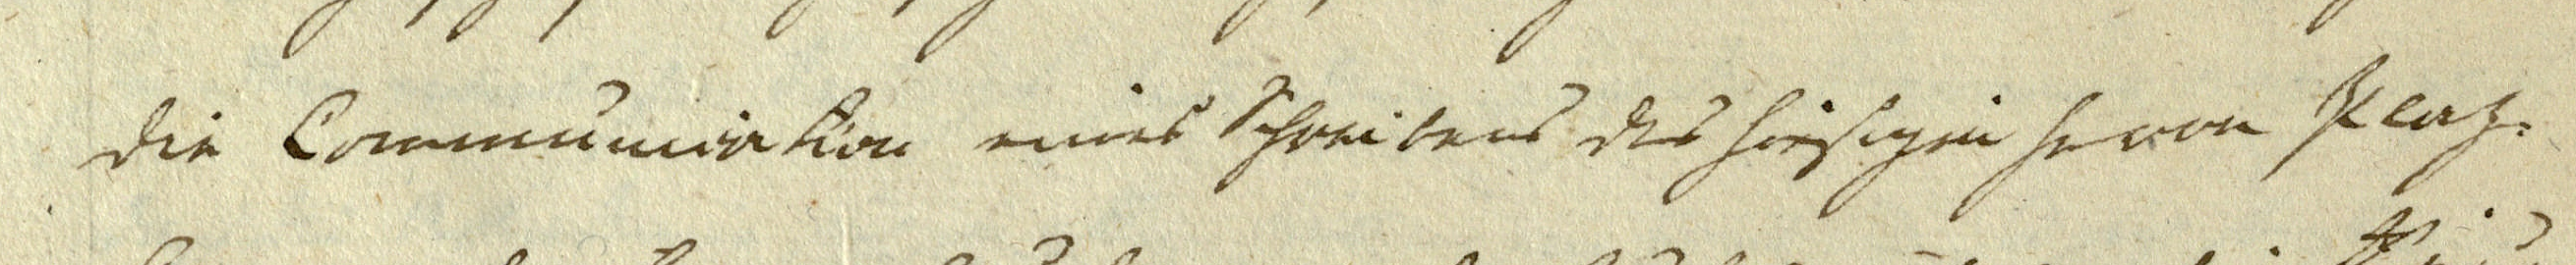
die Communication eines Schreibens des hiesigen Herrn Plaz¬
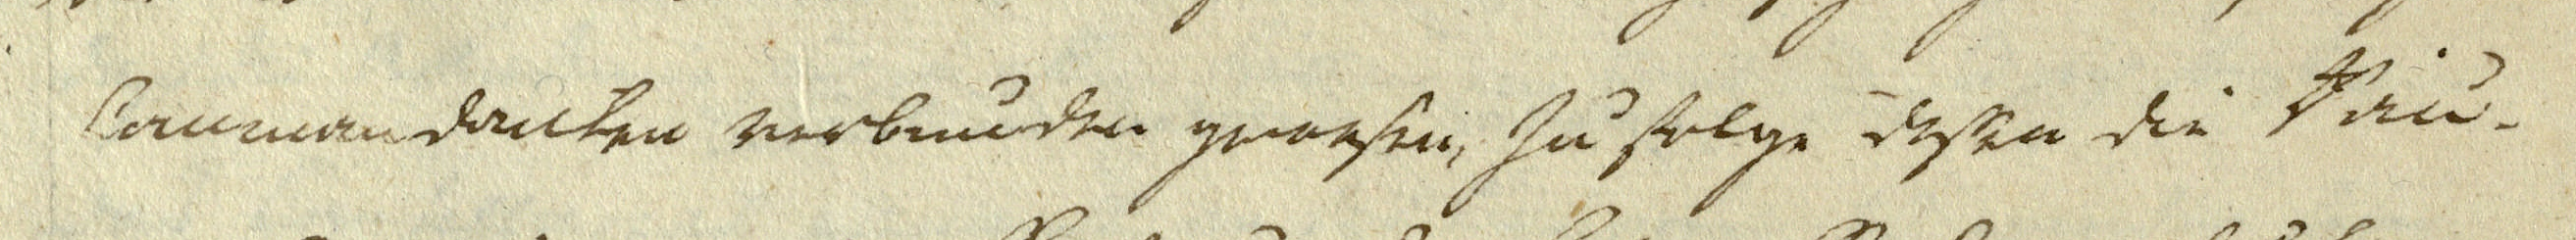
Commandanten verbunden gewesen, zu Folge dessen die Räu¬
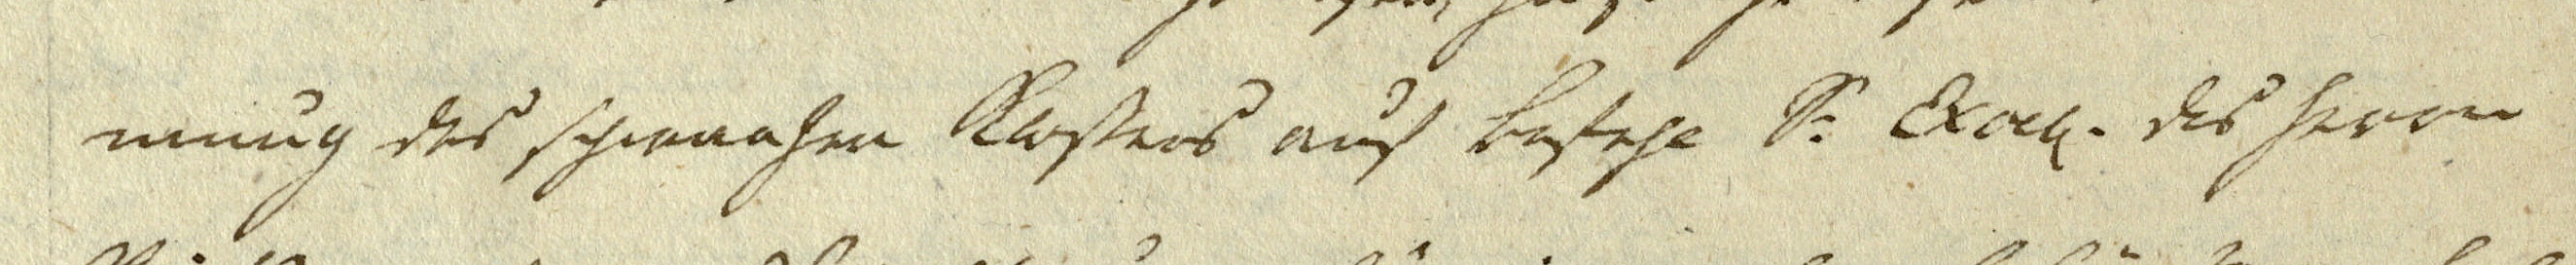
mung des schwarzen Klosters auf Befehl Sr. Excell. des Herrn
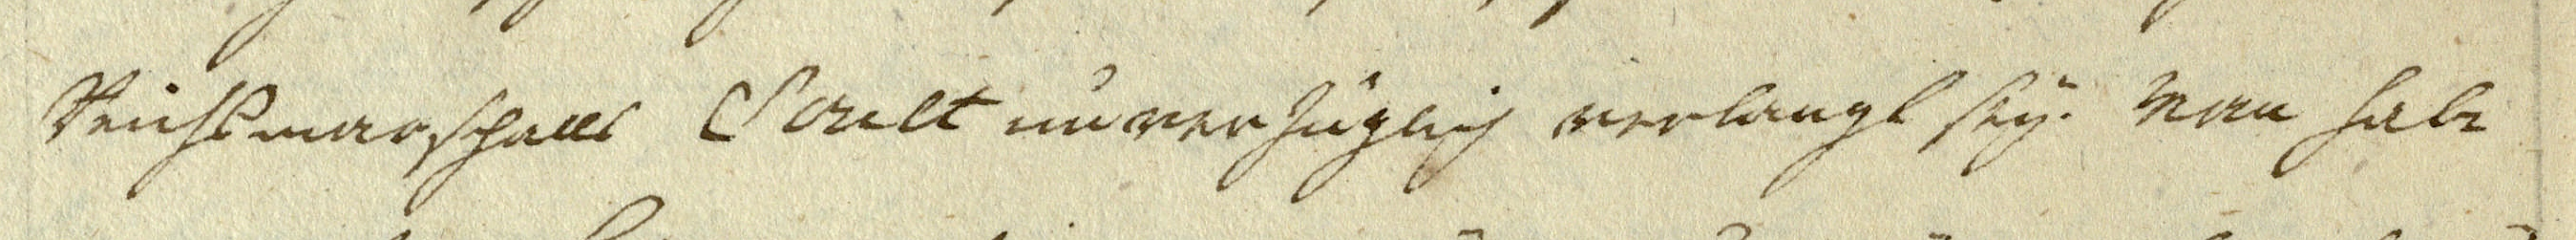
Reichsmarschalls Soult unverzüglich verlangt seÿ. Man habe
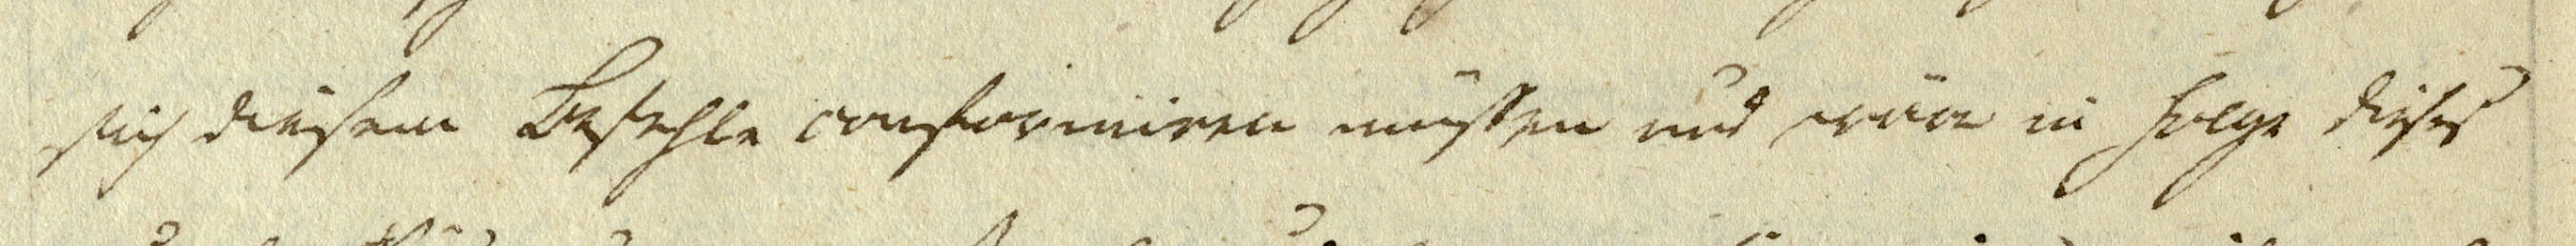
sich diesem Befehle conformiren müssen und wäre in Folge dieses
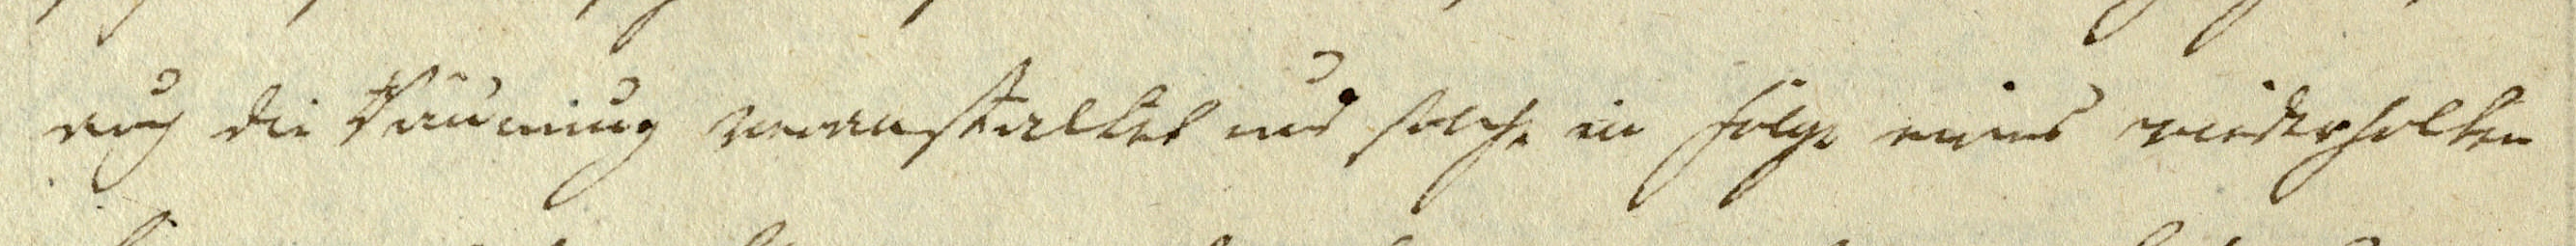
auch die Räumung veranstaltet und solche in Folge eines wiederholten
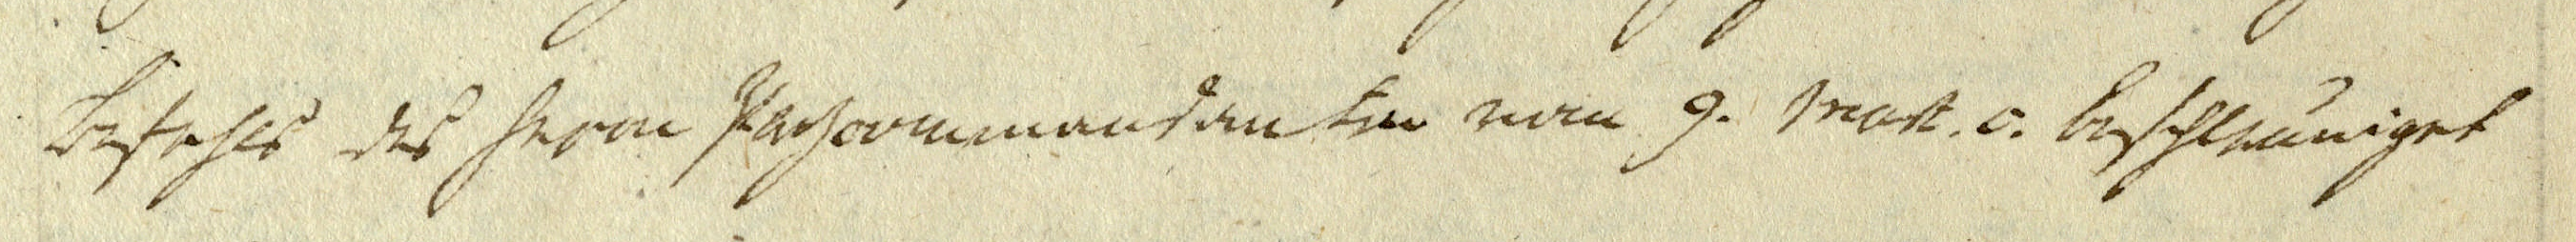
Befehls des Herrn Plazcommandanten vom 9. Mart c. beschleuniget
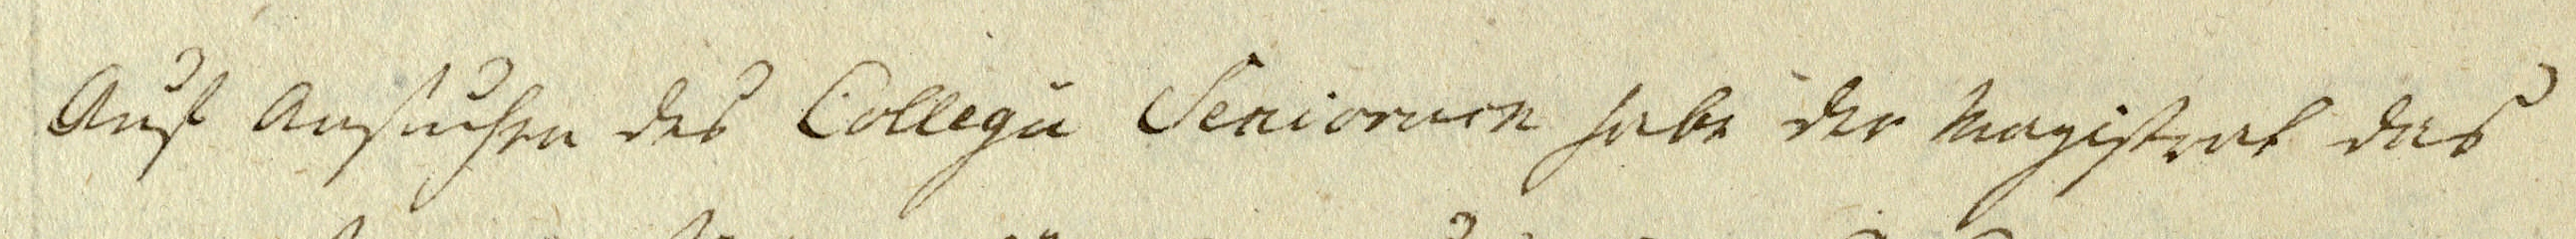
Auf Ansuchen des Collegii Seniorum habe der Magistrat das
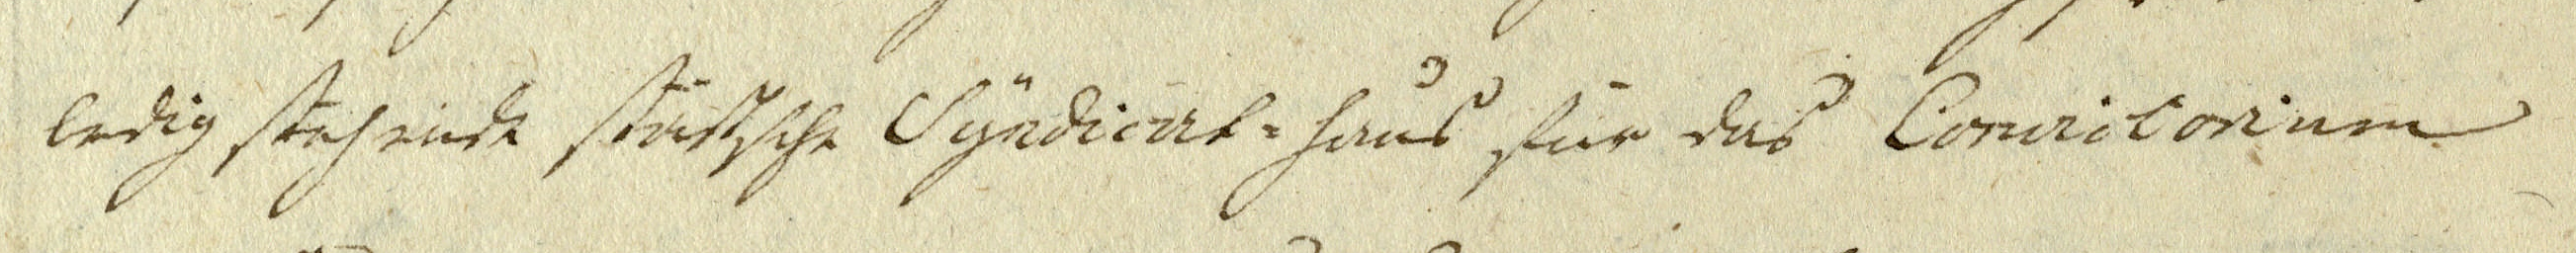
ledig stehende städtsche Sÿndicat-Haus für das Convictorium
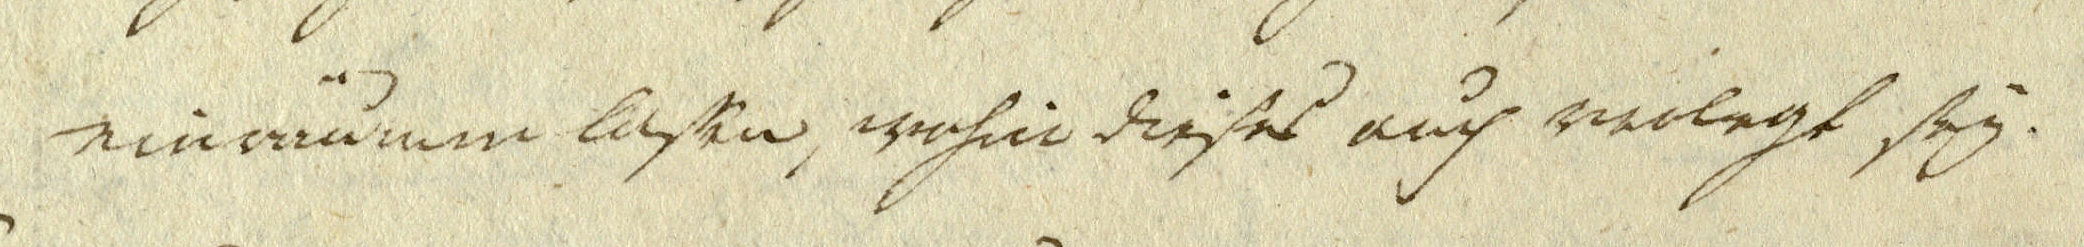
einräumen lassen, wohin dieses auch verlegt seÿ.
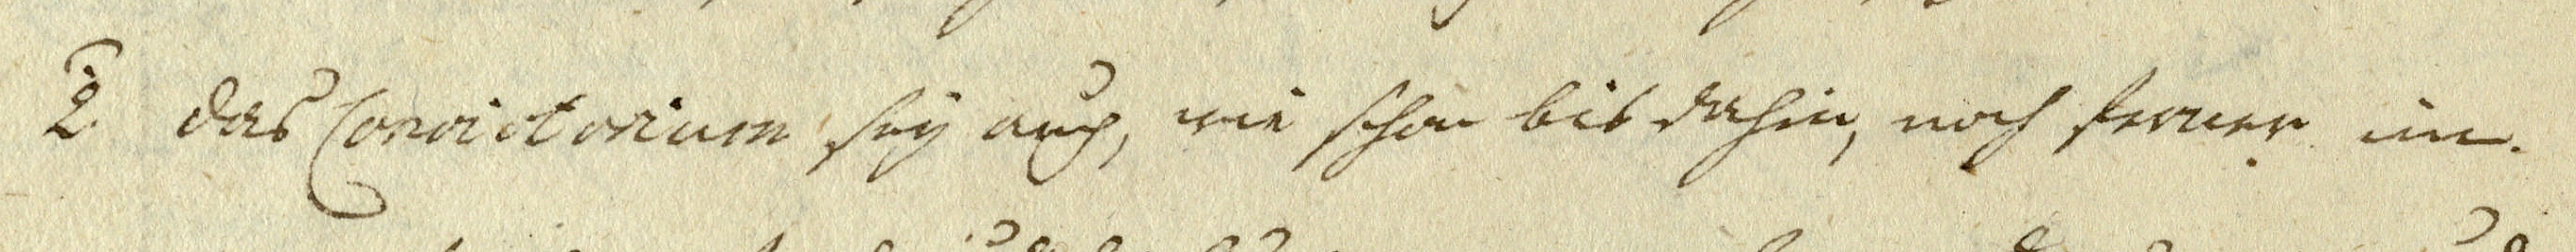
2. Das Convictorium seÿ auch, wie schon bis dahin, noch ferner im¬
